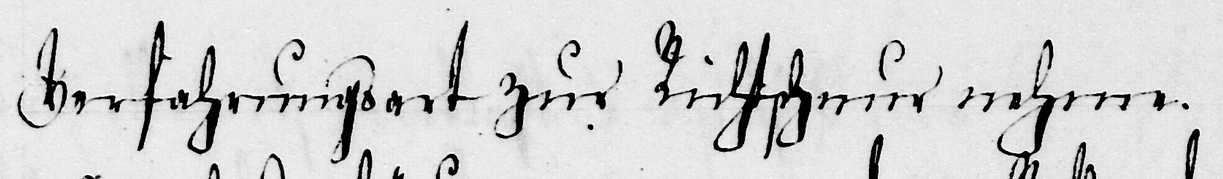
Verfahrungsart zur Richtschnur nehme.
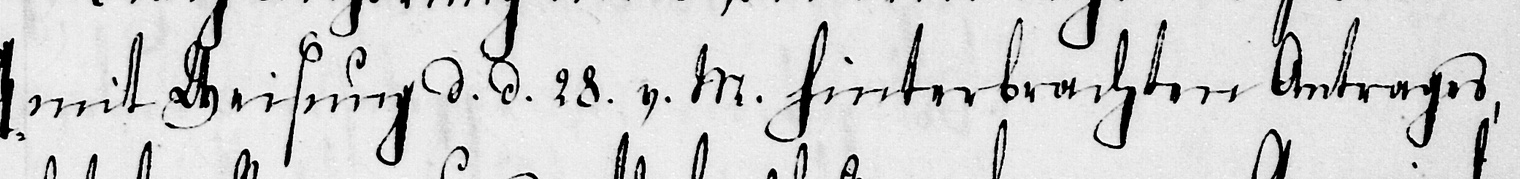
mit Weisung d. d. 28. v. M. hinterbrachten Antrages,
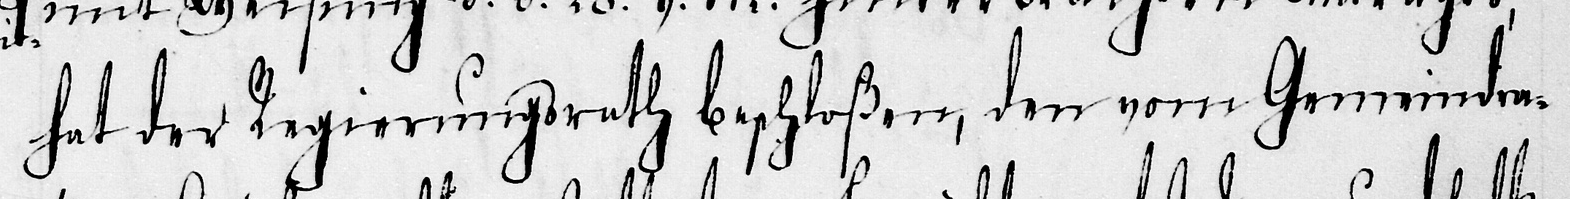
hat der Regierungsrath beschloßen, den vom Gemeindra¬
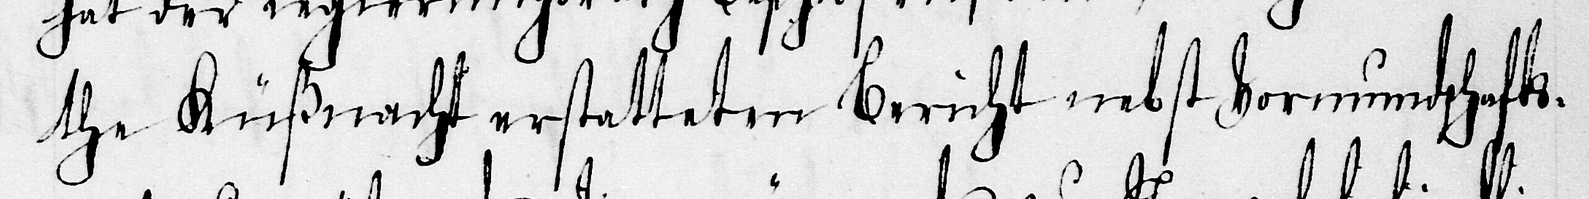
the Küßnacht erstatteten Bericht nebst Vormundschafts¬
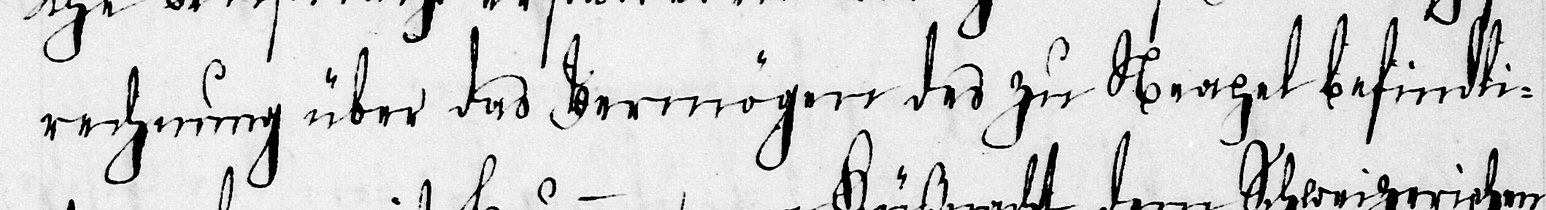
rechnung über das Vermögen des zu Neapel befindli¬
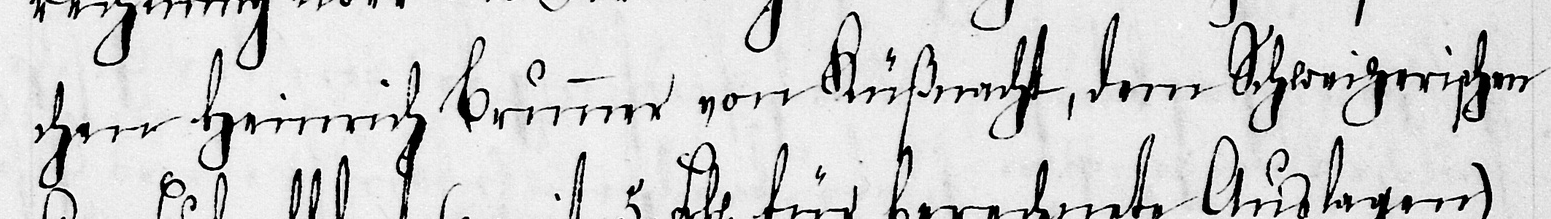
chen Heinrich Brunner von Küßnacht, dem Schweizerischen
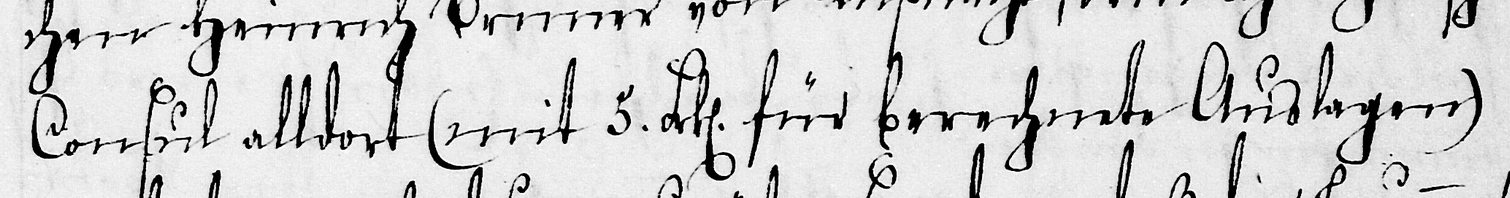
Consul alldort (mit 5. Frk[en] für berechnete Auslagen)
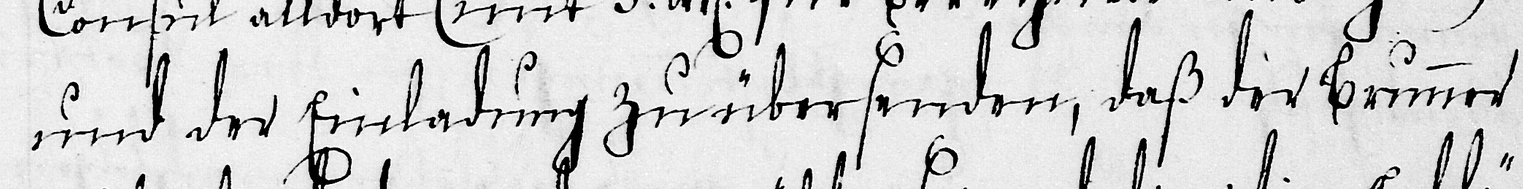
und der Einladung zu übersenden, daß der Brunner
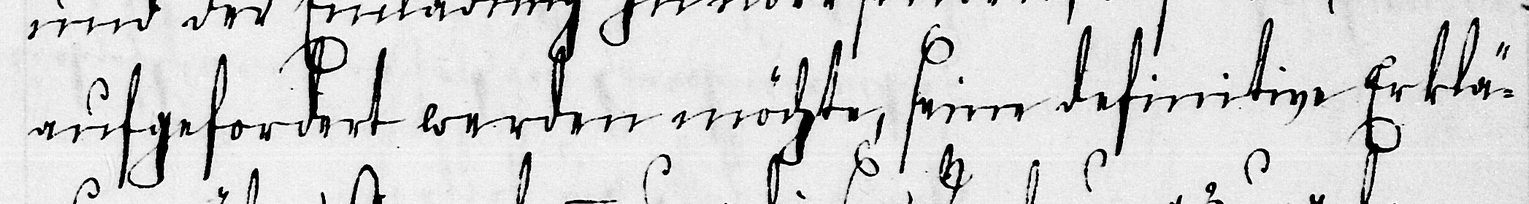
aufgefordert werden möchte, seine definitive Erklä¬
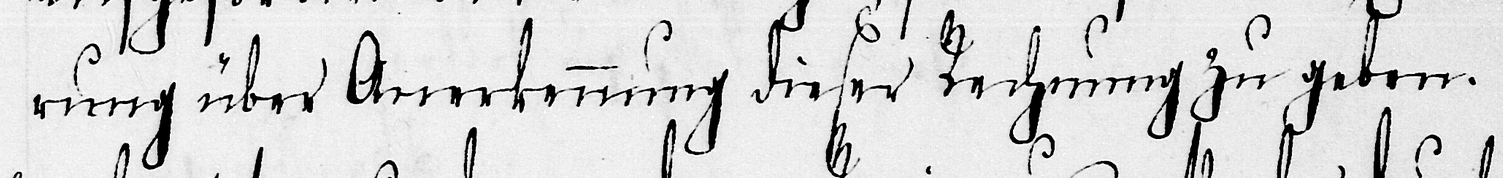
rung über Anerkennung dieser Rechnung zu geben.
